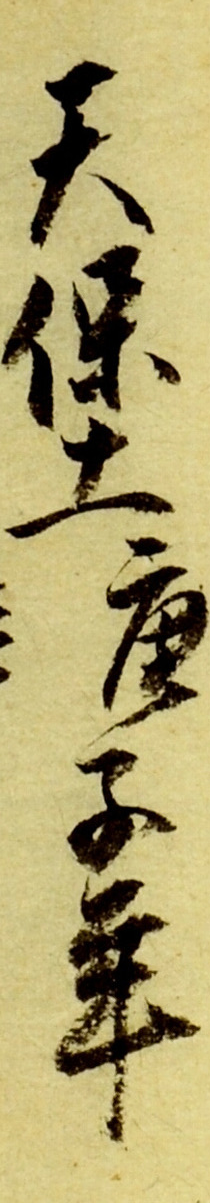天保十一庚子年
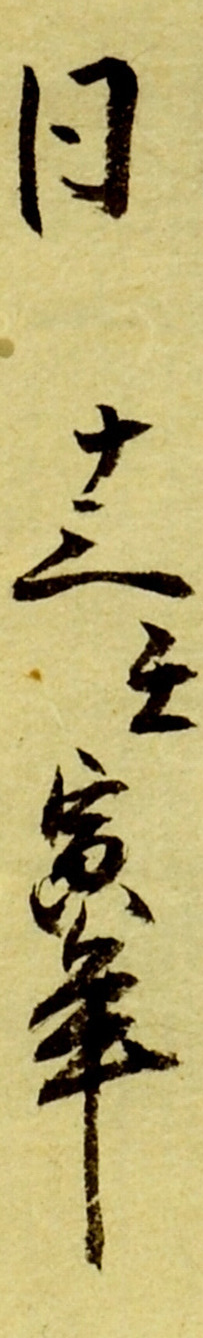同十三壬寅年
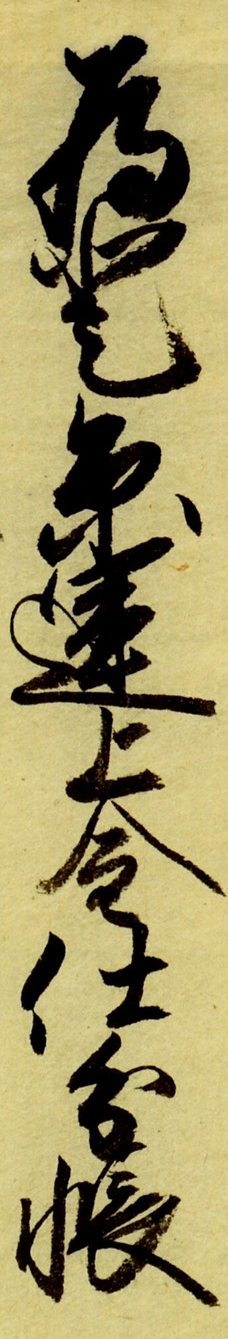為登糸運上金仕分帳
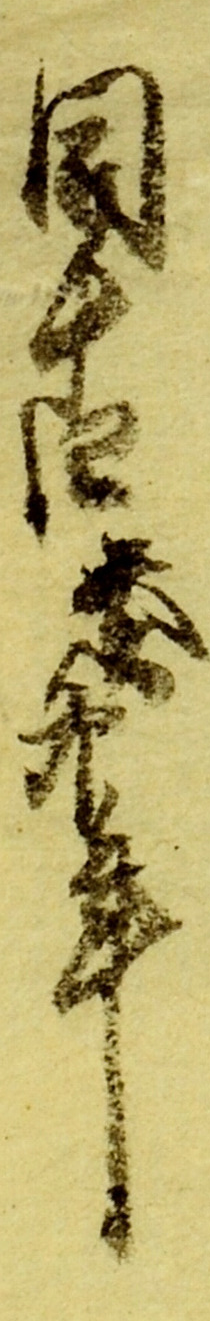同十四癸卯年
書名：為登糸運上金仕分帳
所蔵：伊那市立高遠町図書館・合同会社AMANE
